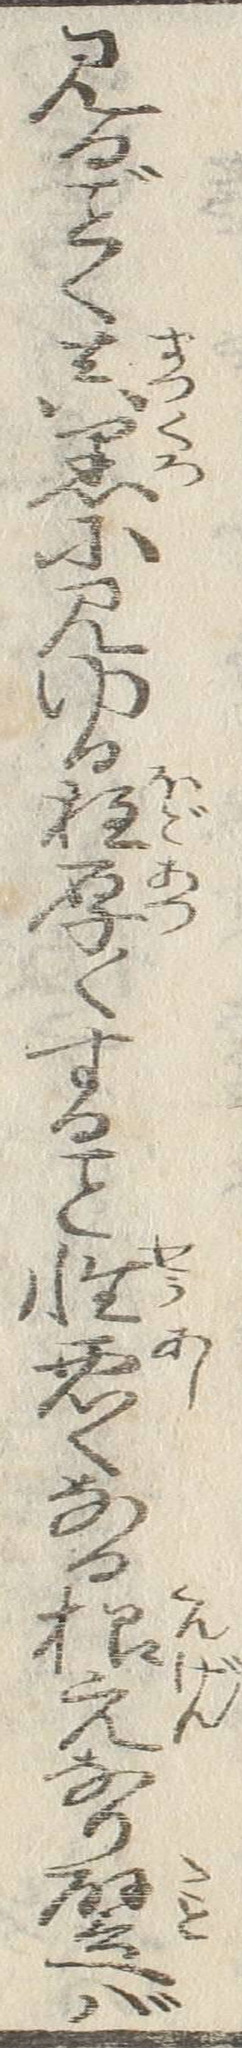見るごとく真黒に見ゆる程厚くすること性悪くなる根元なり譬へば
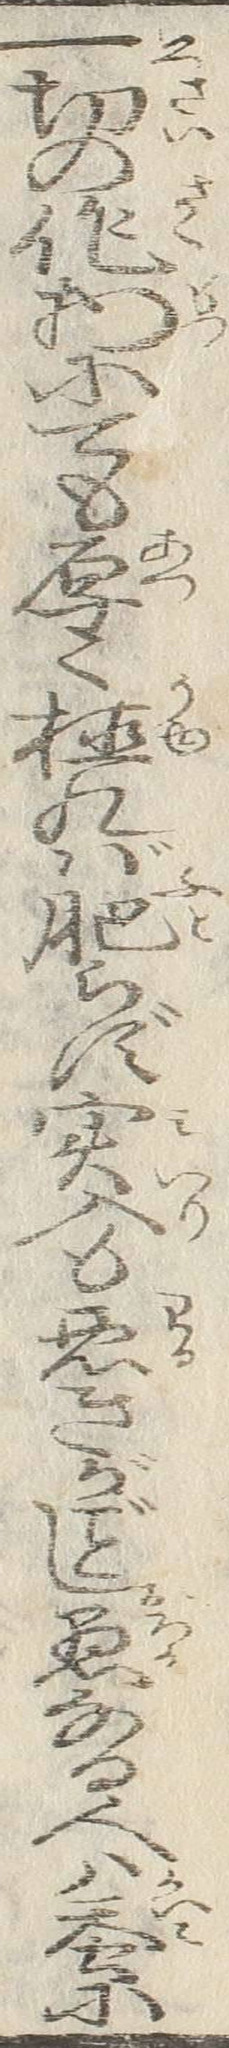一切の作物にても厚く植れば肥らず実入も悪きがごとし愚なる人は蚕に
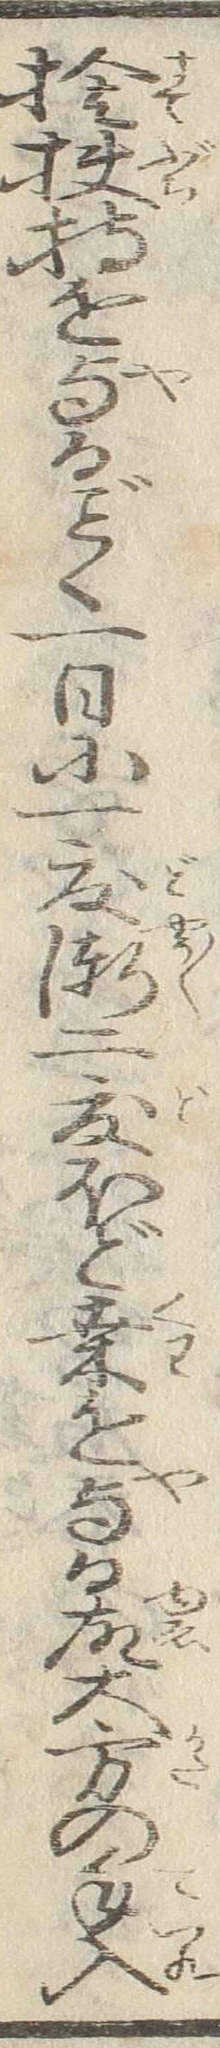捨扶持を与るごとく一日に一度漸二度ほど桑を与る故大方の手入

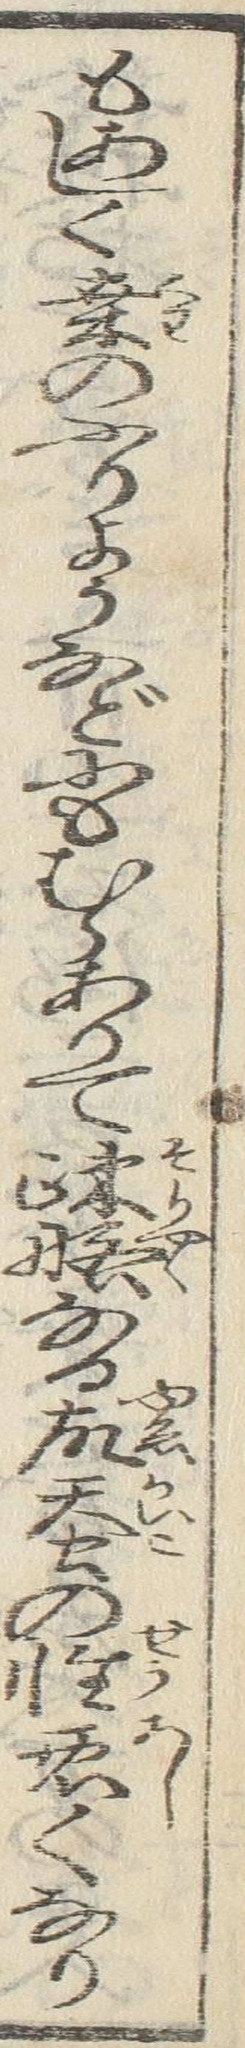もあしく桑のふりようなどにもむらありて疎略なる故蚕の性悪くなり
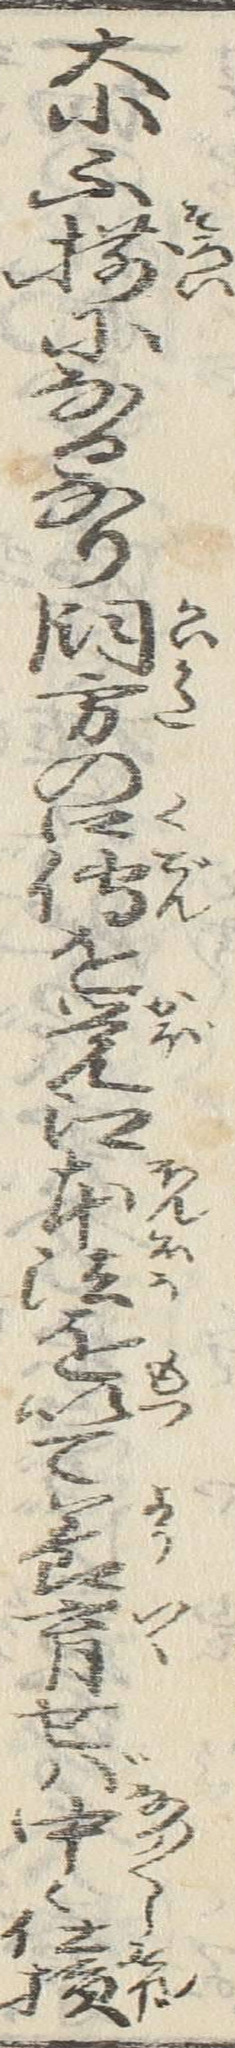大小ふ揃になるなり飼方の口傳を覚え本法を以て養育せば中々仕損
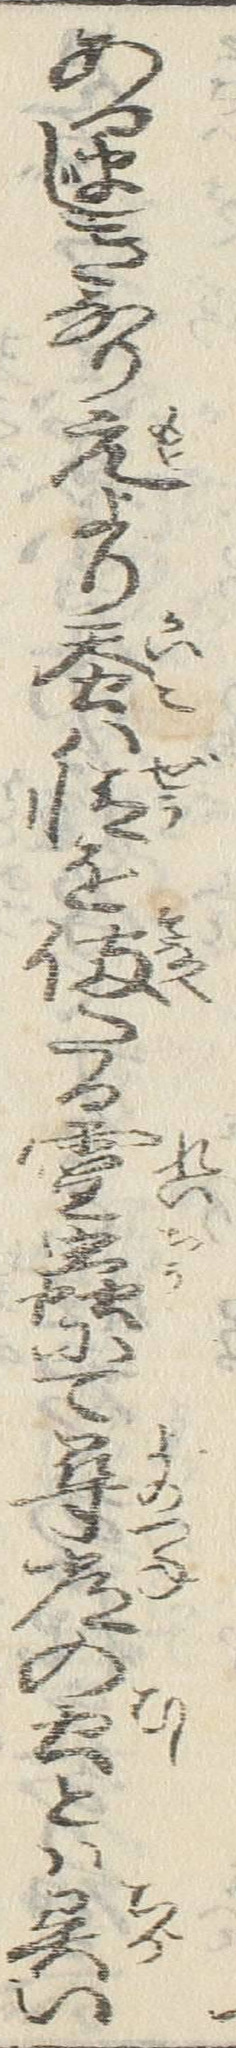あるまじきなり元より蚕は情を備たる霊蟲にて尋常の虫とは異い
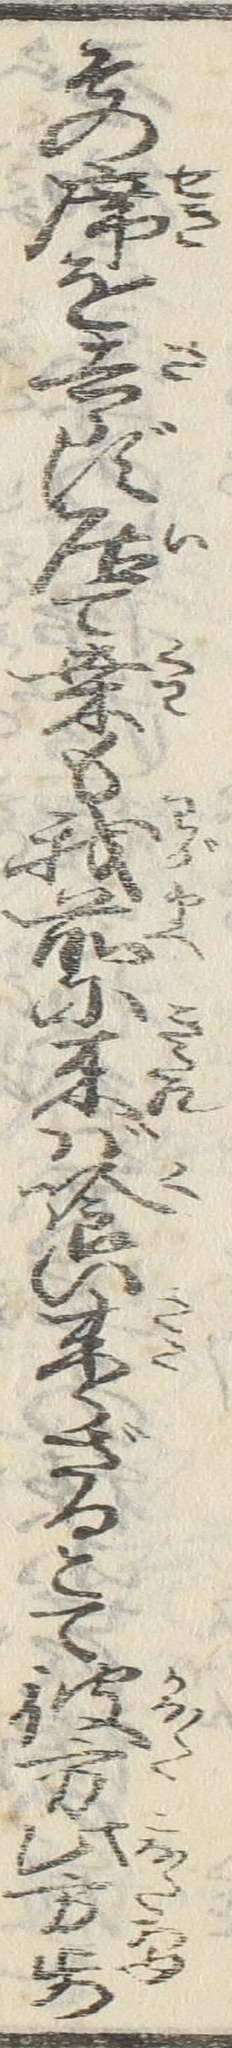その席を去らず居て桑も我前に来ば喰い来らざるとて彼方此方歩
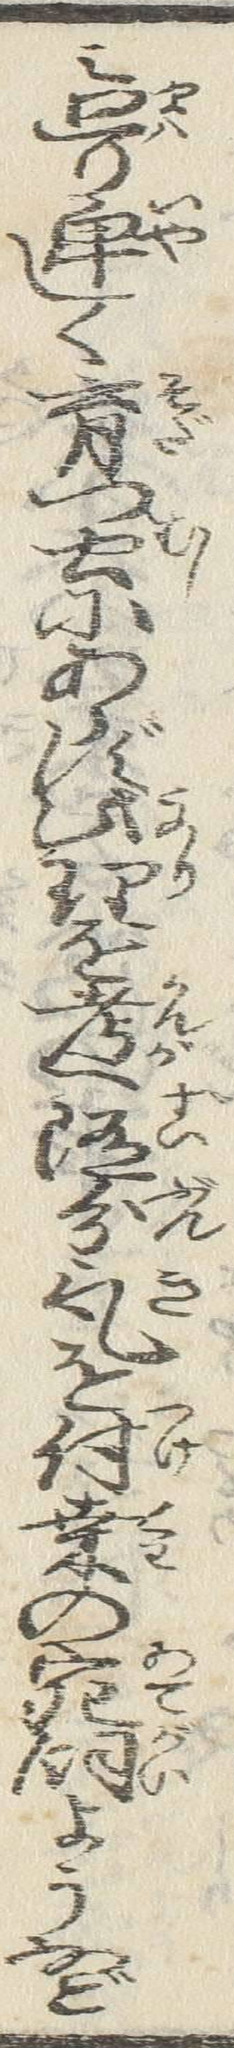み廻り卑しく育つ虫にあらず此理を考へ随分気を付桑の宛飼ようなど
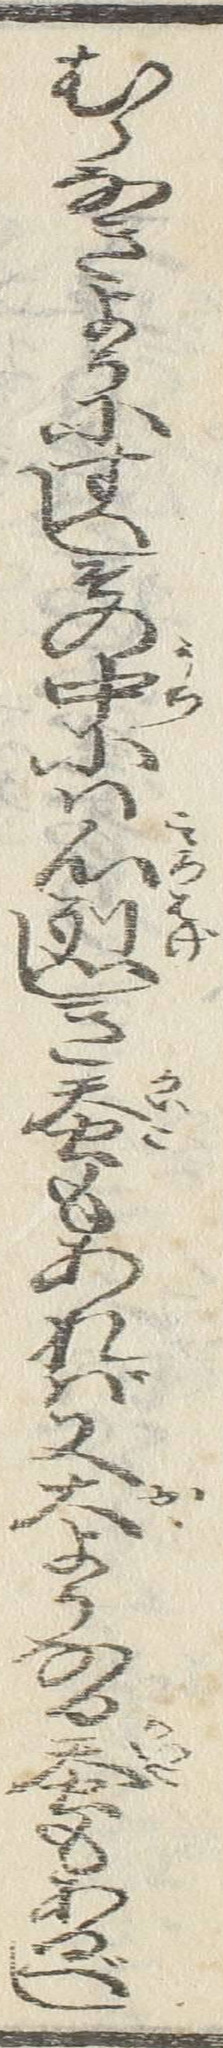むらなきようにすへしその中には心烈しき蚕もあれば又大ようなる蚕もあるべし
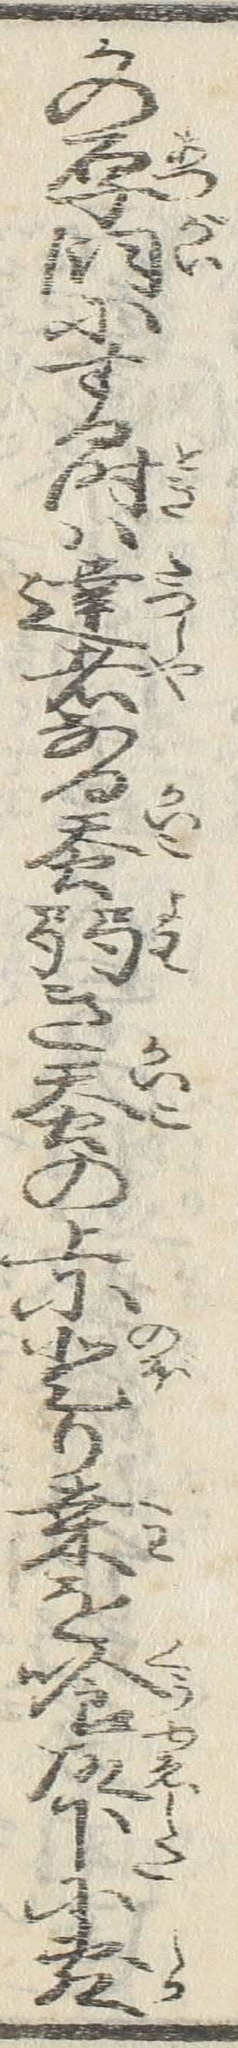かの厚飼にする時は達者なる蚕弱き蚕の上に登り桑を喰故下に敷
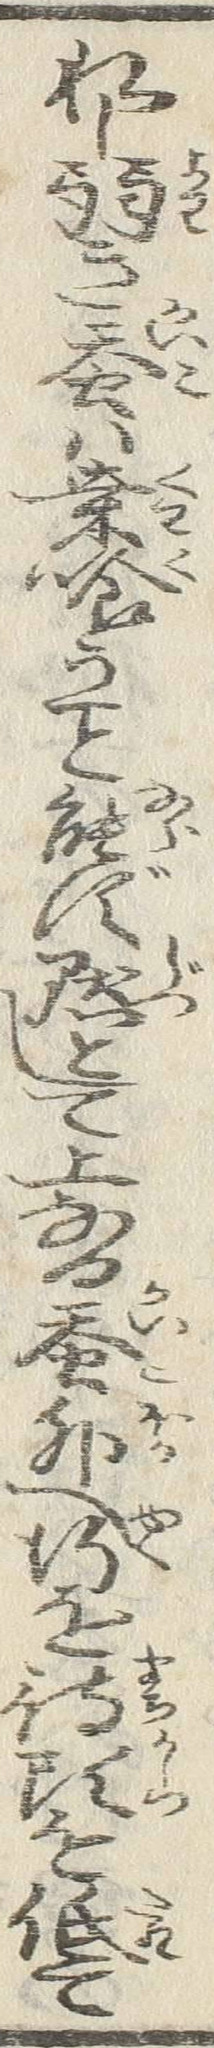れし弱き蚕は桑喰うこと能ず然として上なる蚕外へ行を待頭を低て
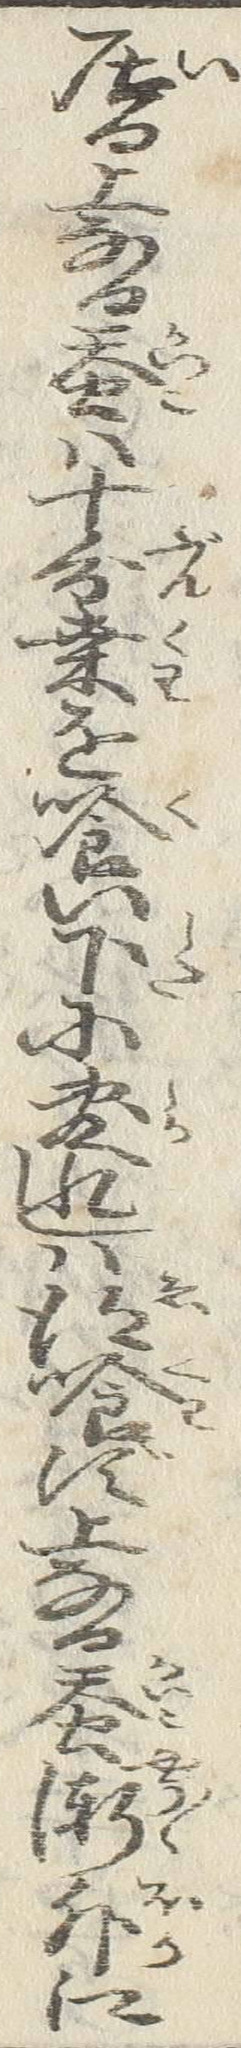居る上なる蚕は十分桑を喰い下に敷れしは得喰ず上なる蚕漸外え
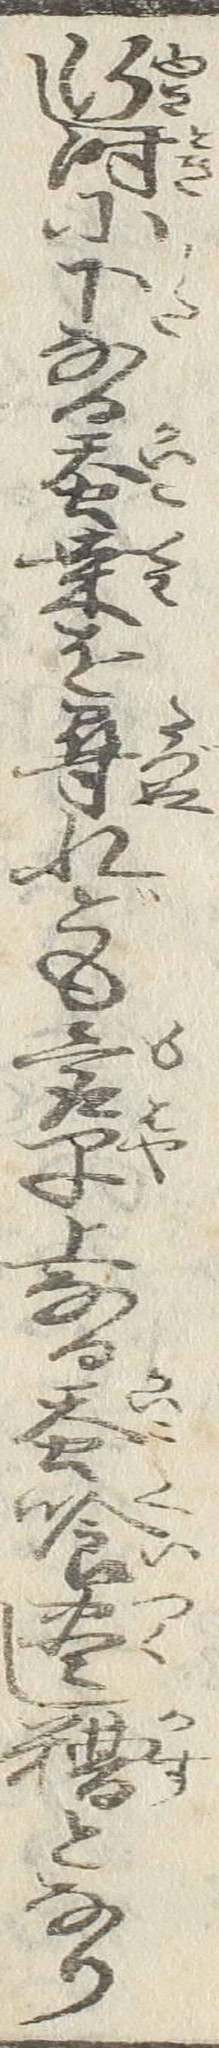行し時に下なる蚕桑を尋れども最早上なる蚕喰尽し糟となり
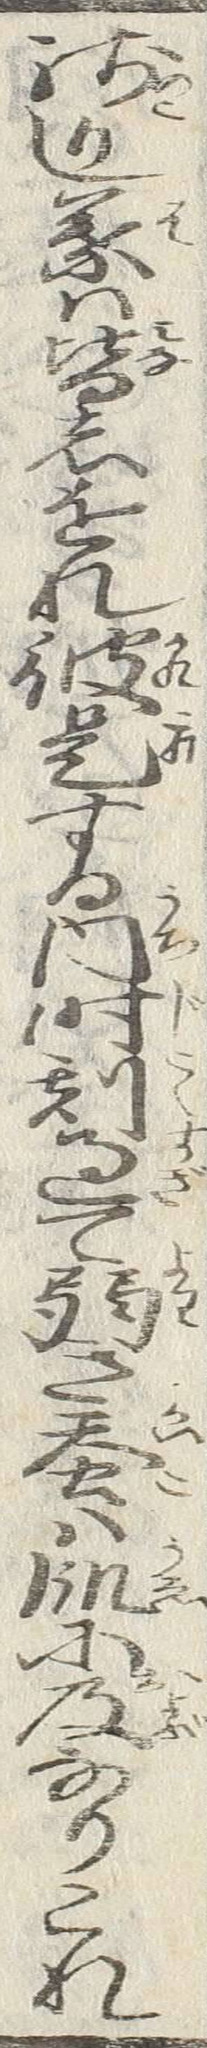残りし葉は皆しをれ彼是する内時刻過て弱き蚕は飢に及なりこれ
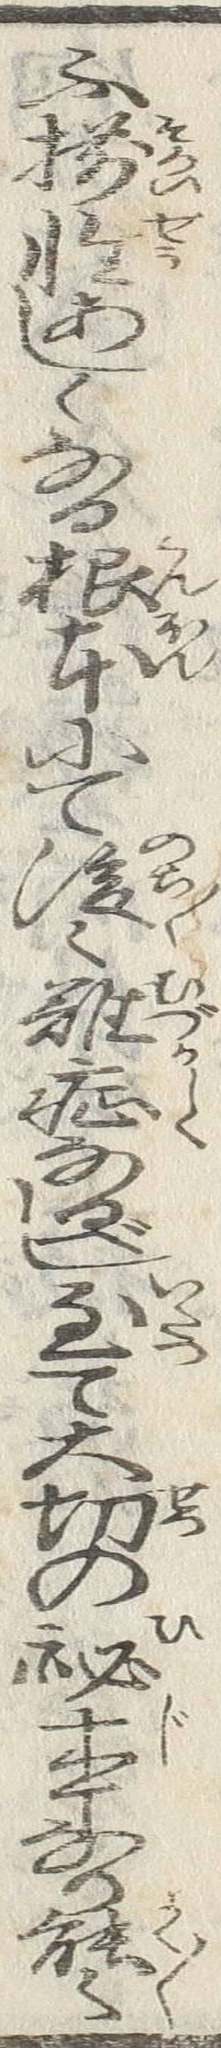ふ揃性あしくなる根本にて後々難症なるべし至て大切の秘事なり能々
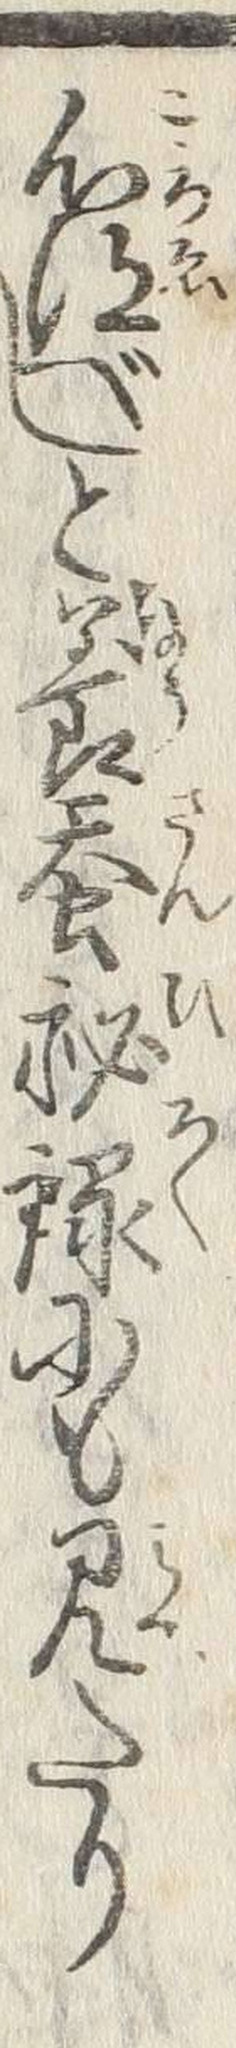心得べしと養蚕秘録にも見たり
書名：養蠶實驗録
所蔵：東京大学農学生命科学図書館 国文学研究資料館
